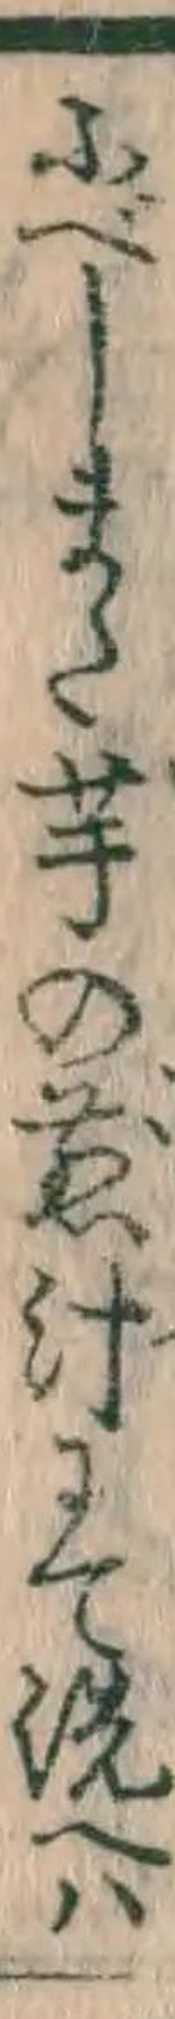ふべしまた芋の煎汁にて洗へは
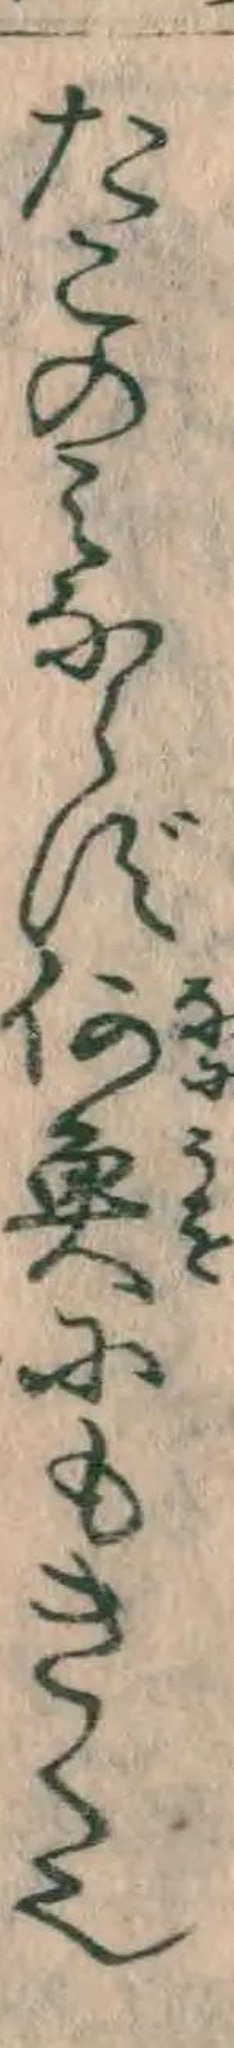たこのみならず何魚にもきく也
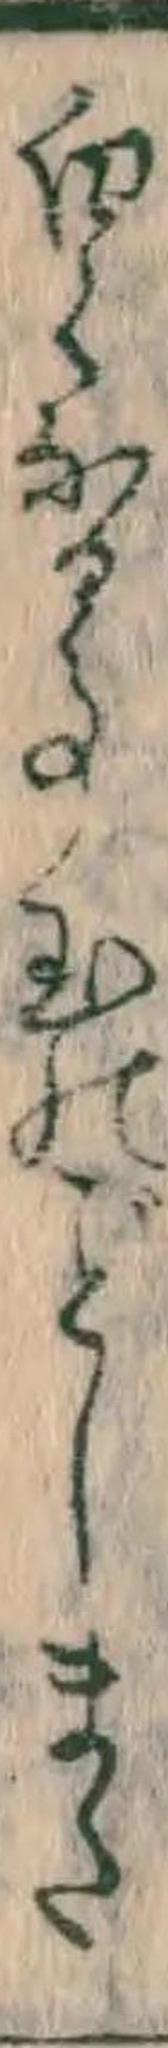白くなる事玉のごとしまた
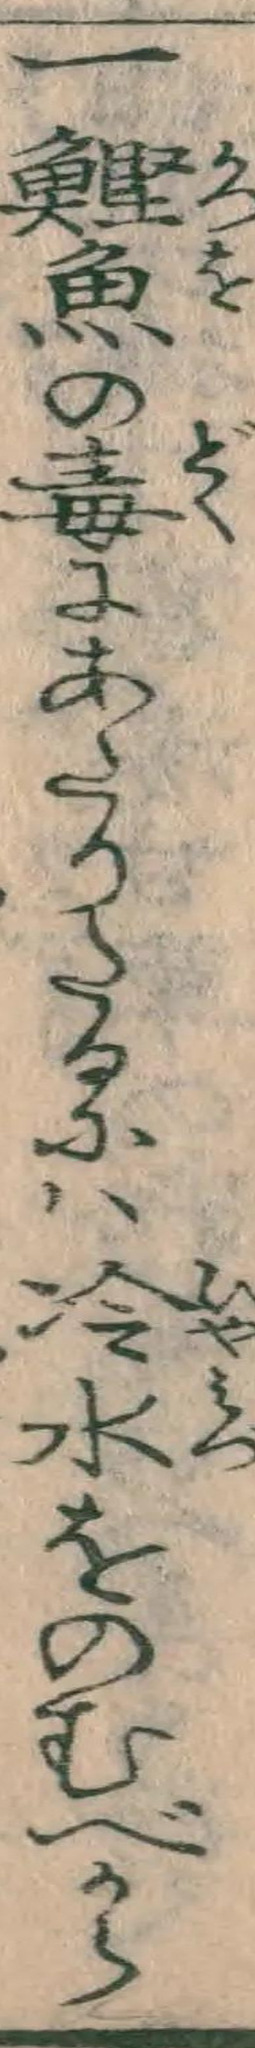一鰹魚の毒にあたりたるには冷水をのむべから
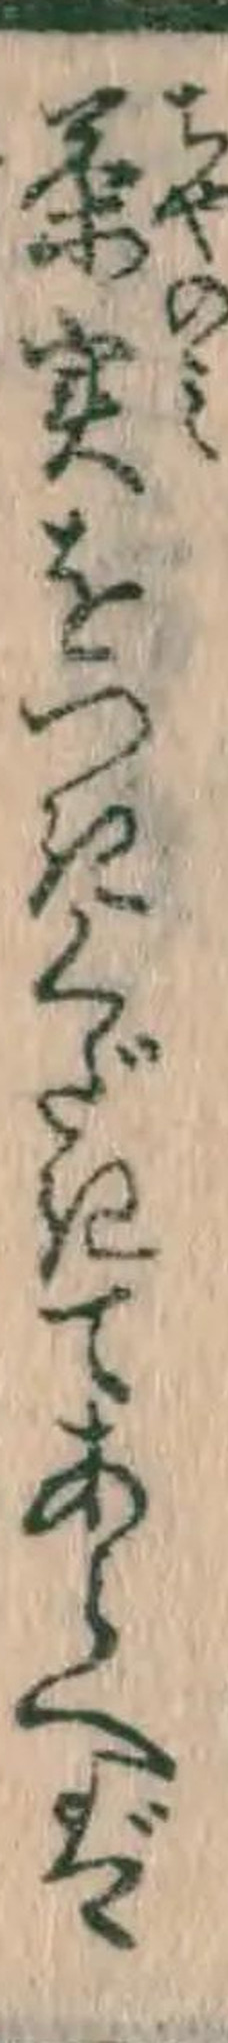茶実をつきくだきてあらへば
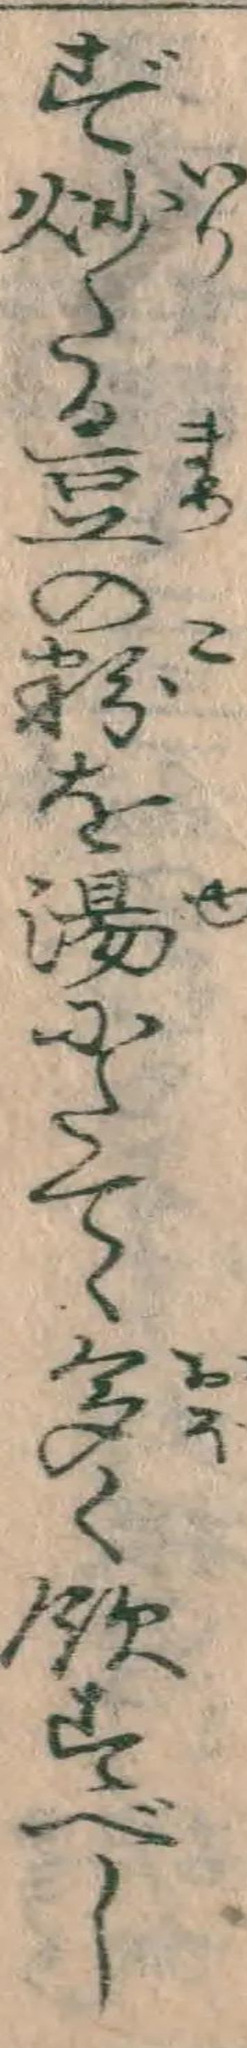ず炒たる豆の粉を湯にたてゝ多く飲すべし
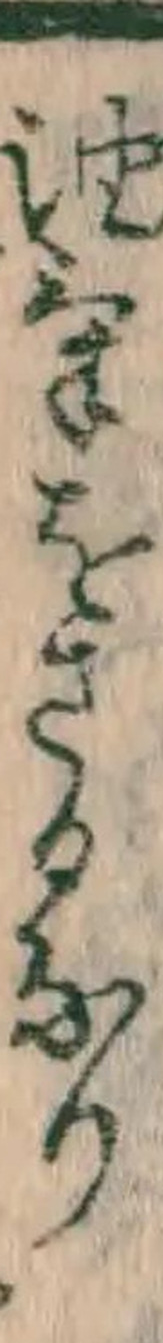油気をさるなり
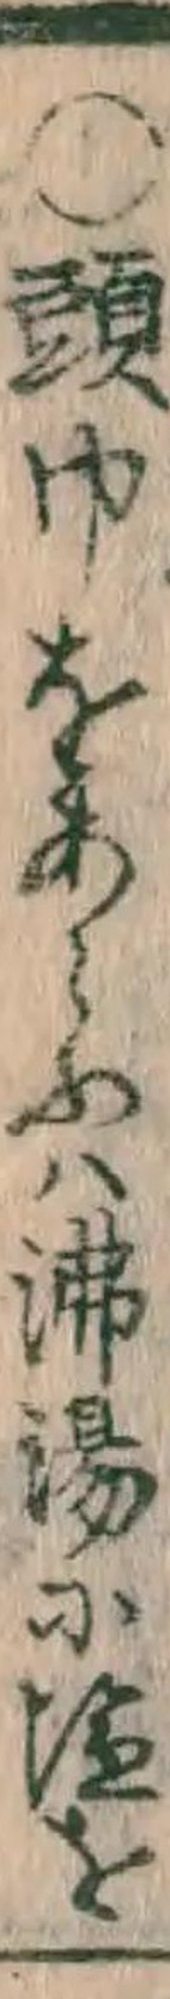○頭巾をあらふは沸湯に塩を
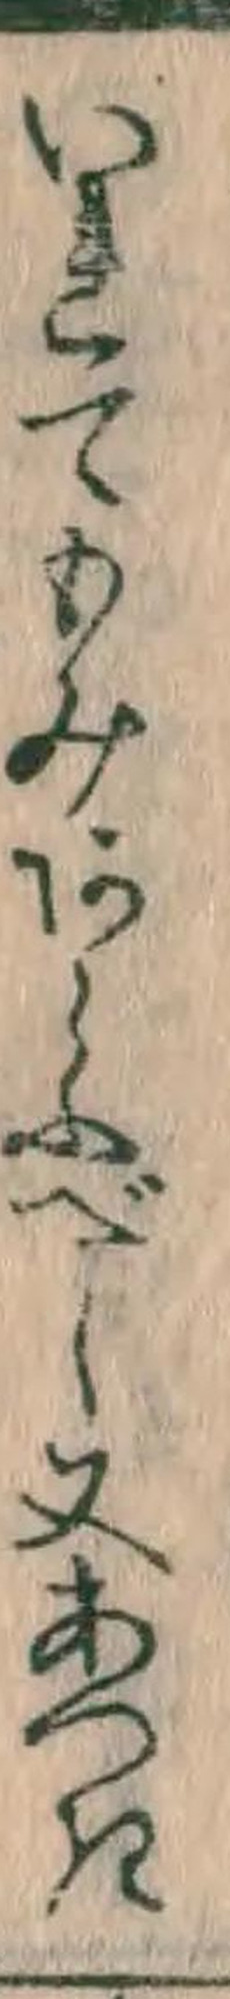いれてもみあらふべし又あつき
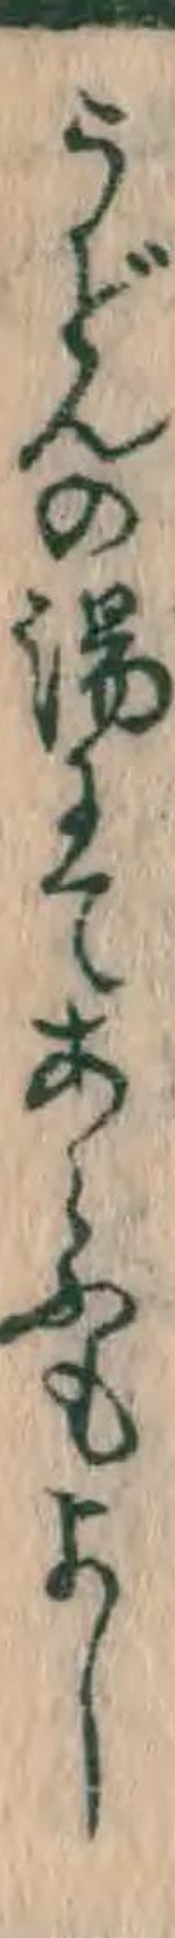うどんの湯にてあらふもよし
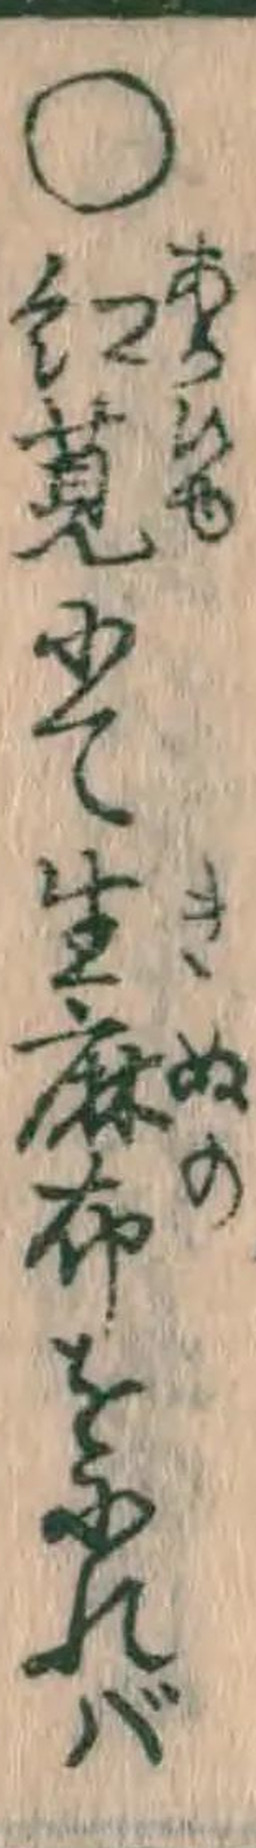○紅莧にて生麻布をにれば
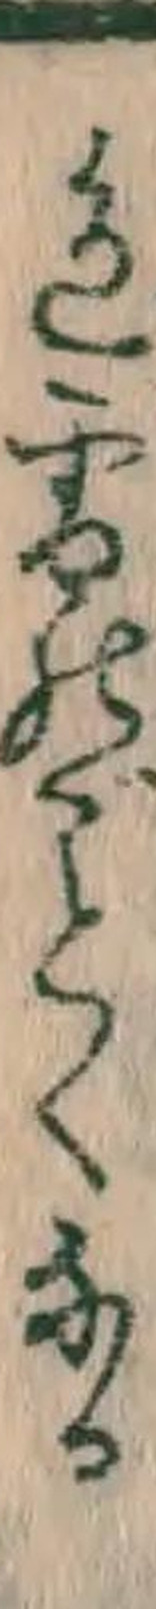色雪のごとくなる
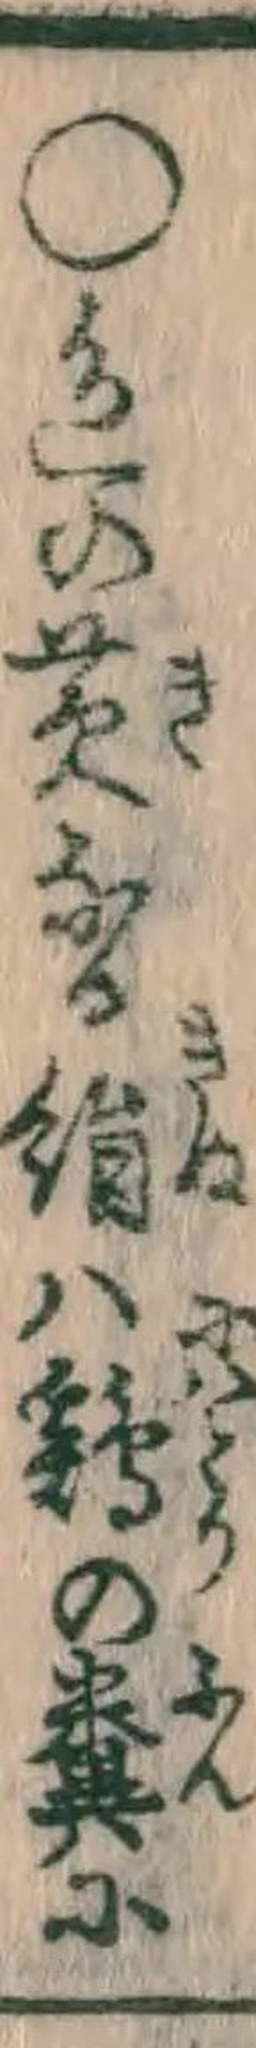○色の黄なる絹は鶏の糞に
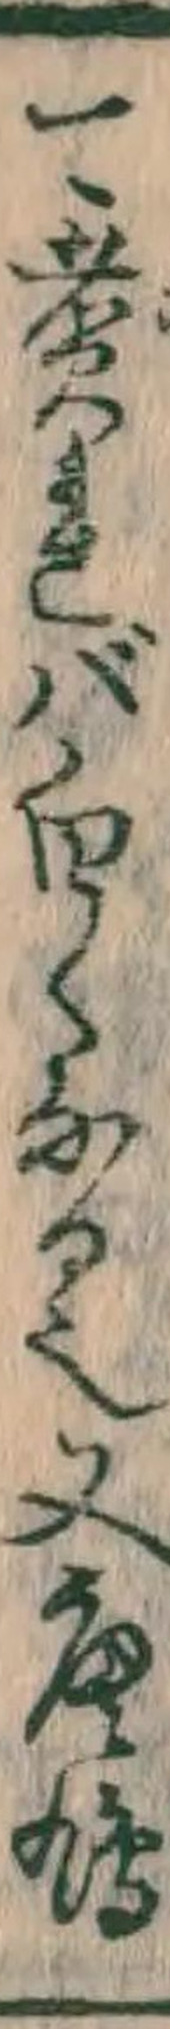て煮れば白くなる也又唐鳩
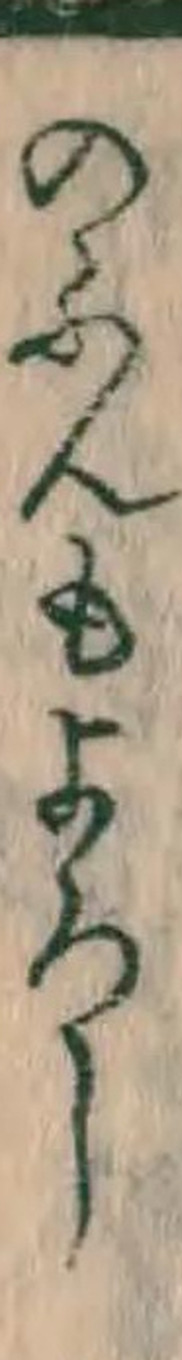のふんもよろし
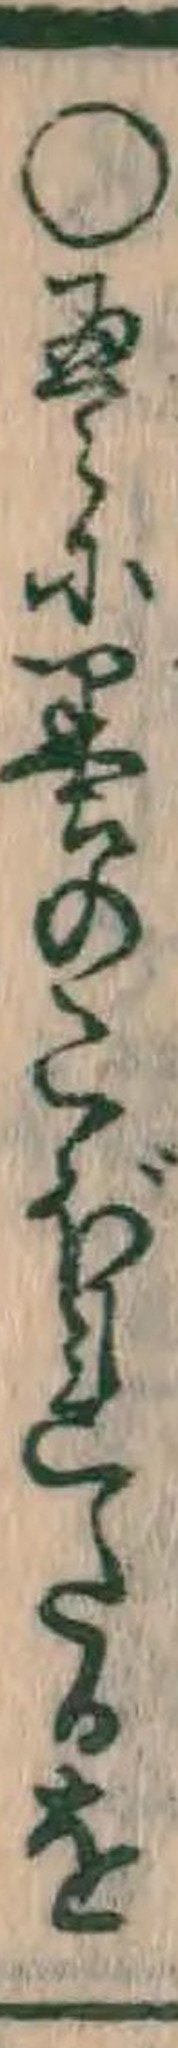○畳に墨のこぼれたるを
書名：広益秘事大全 3巻. [3]
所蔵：国立国会図書館 National Diet Library, JAPAN
